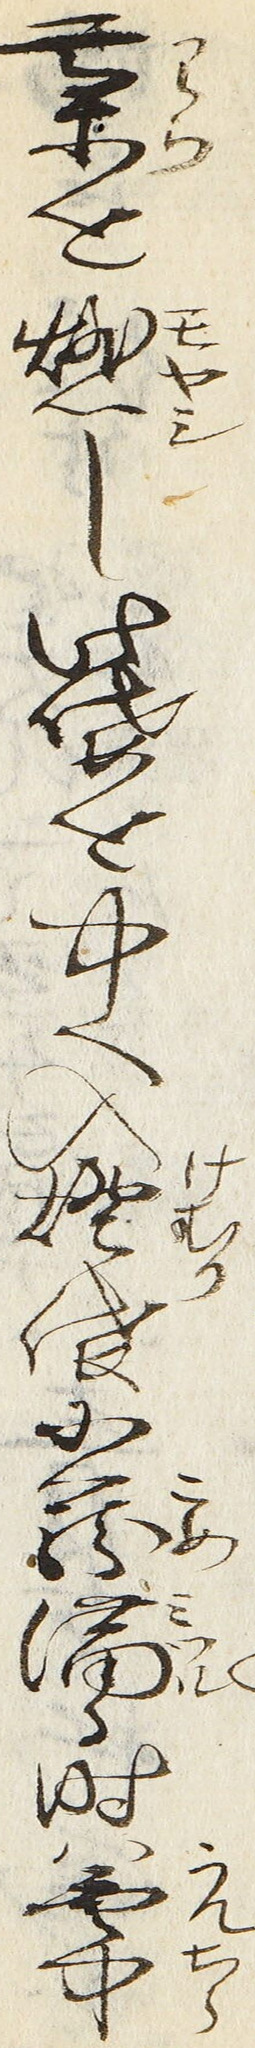藁を燃し此袋を中へ入煙袋に籠満る時は雲中
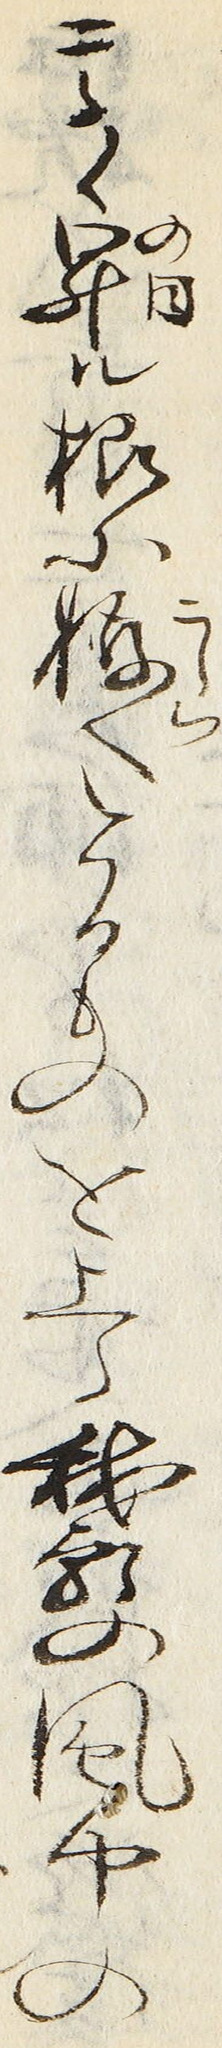高く昇る様に拵へたるものを上る我朝の風中の
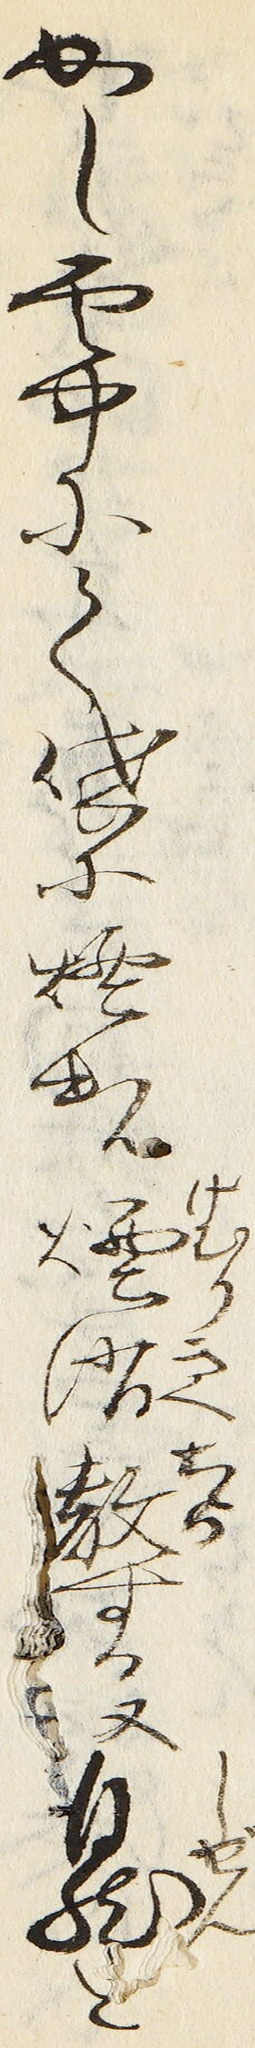如し空中にて袋に煙出る煙消散すか又自然と
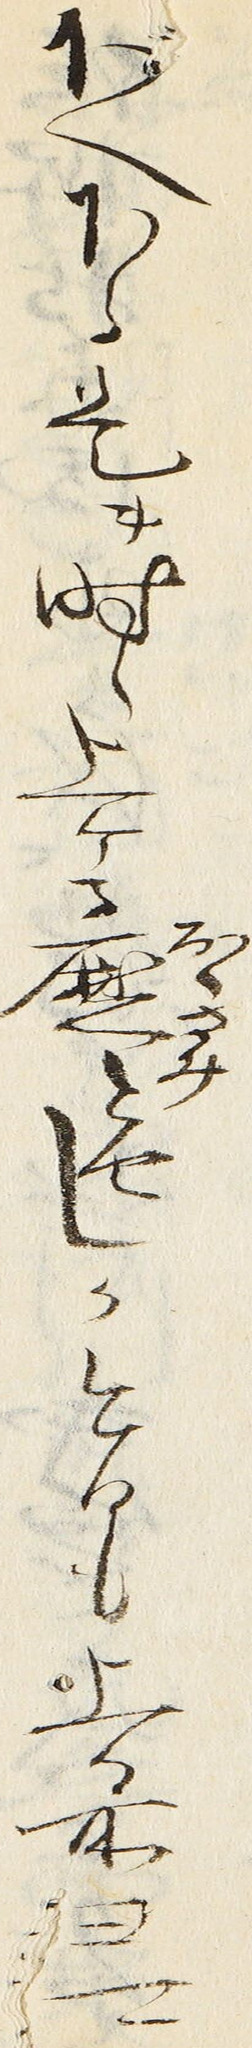下へ下る是を時々上ける慰とせしか今日も上る所ヨマ
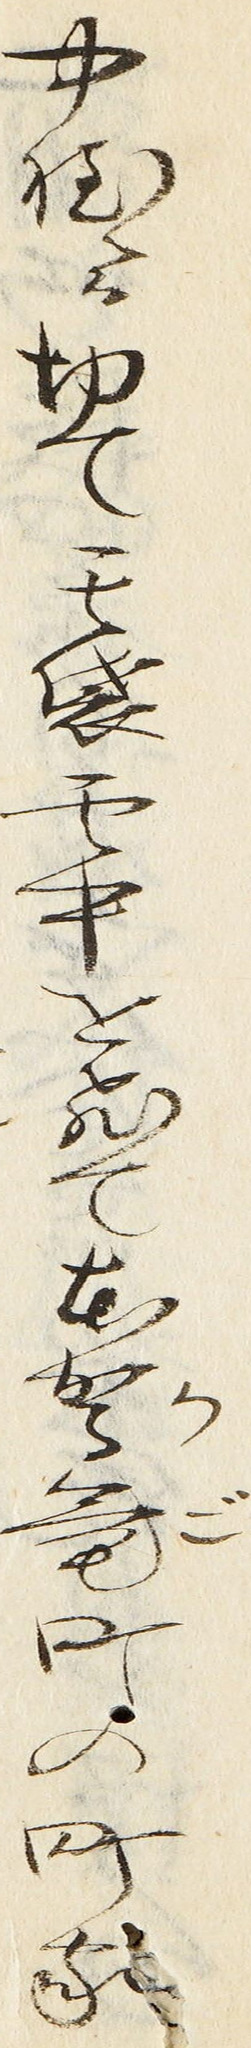中程にて切て其袋空中を飛て本駕篭町の町家
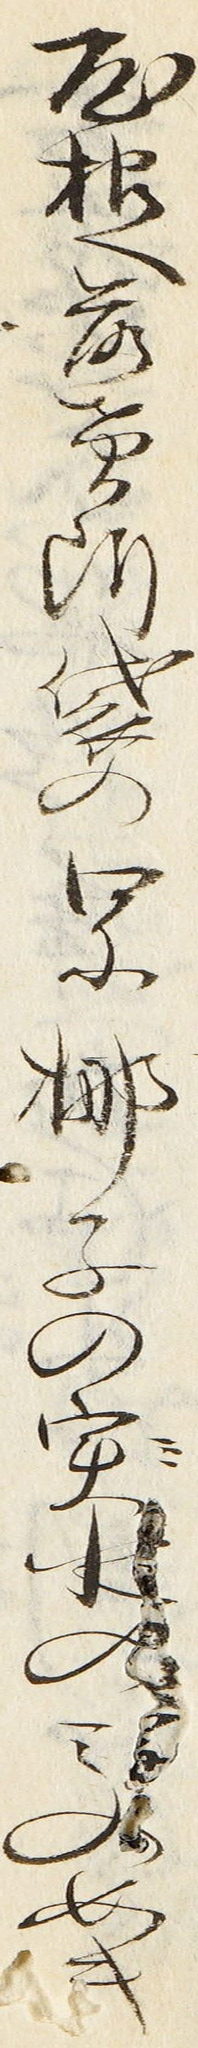屋根へ落ける所袋のの口に椰子の実水のみの如き
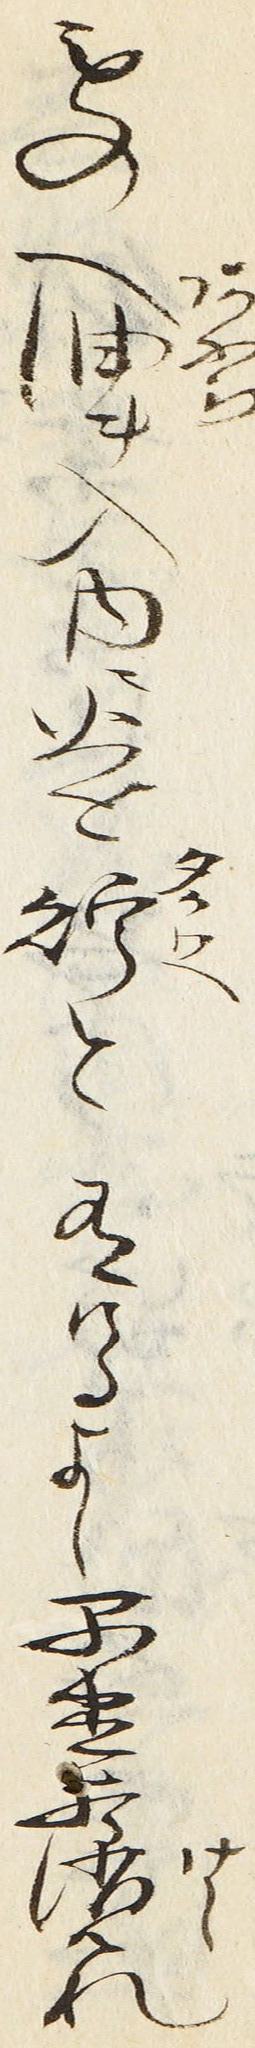もの油を入内に火を貯と有けるよし早速打消けれ
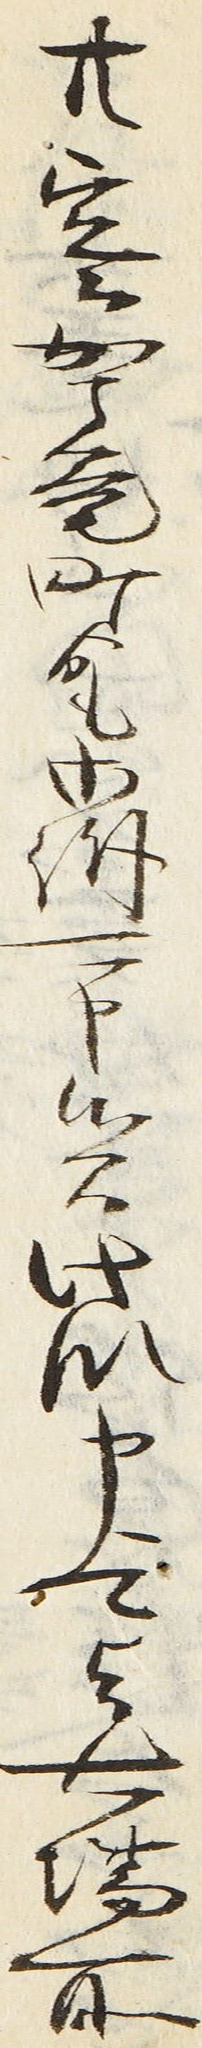共定て駕篭町よりも御訴可申候間此段申上候旨右場所
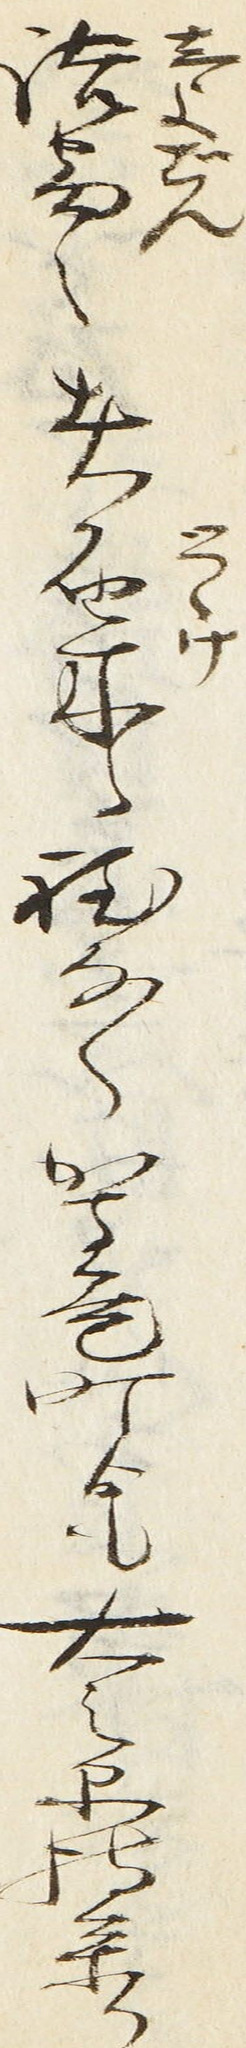詰番之者届来る程なく駕篭町よりも右の品持参り
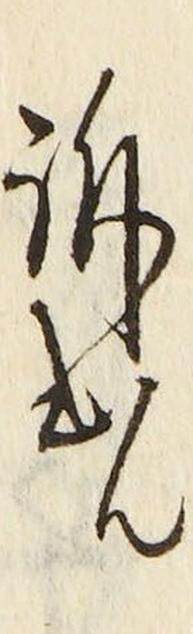訴出ん

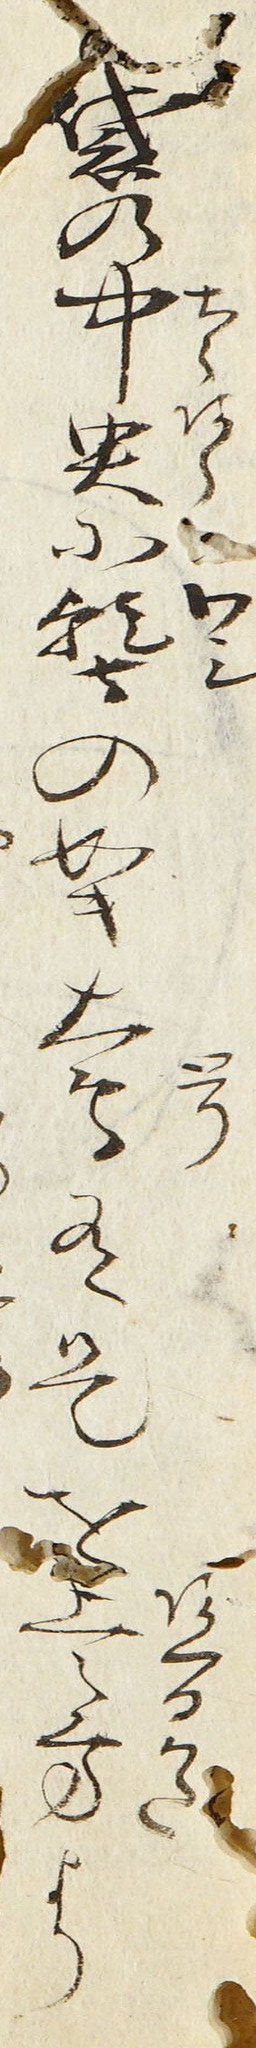袋の中央に鷲の如き大鳥有是を上之方より
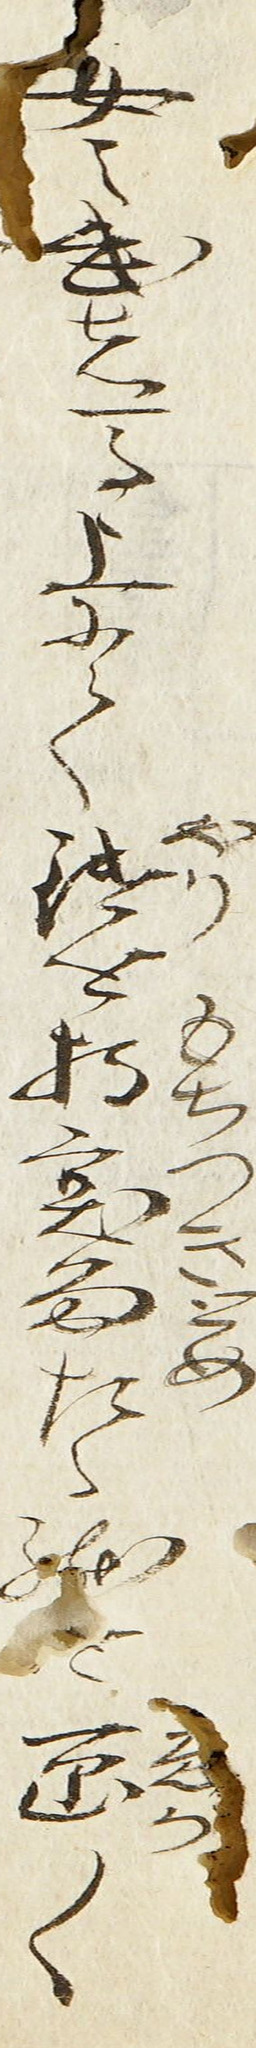女之武者馬上にて鑓を持突留たる躰を画く
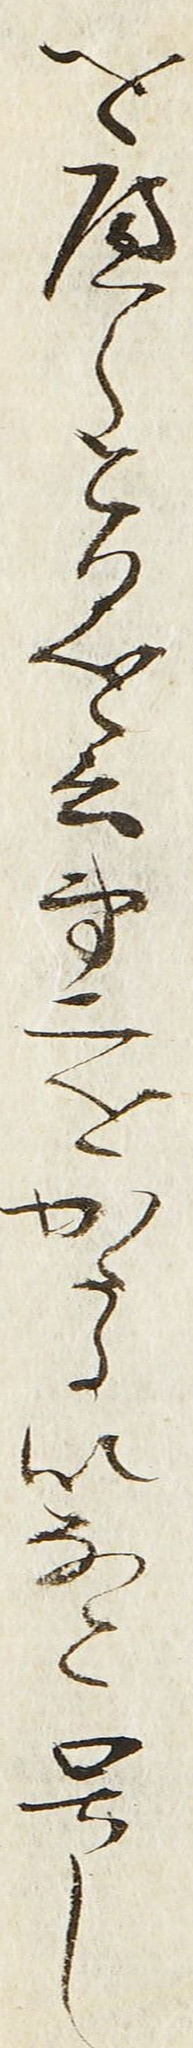をへうとると云第二をかたるいなと号し
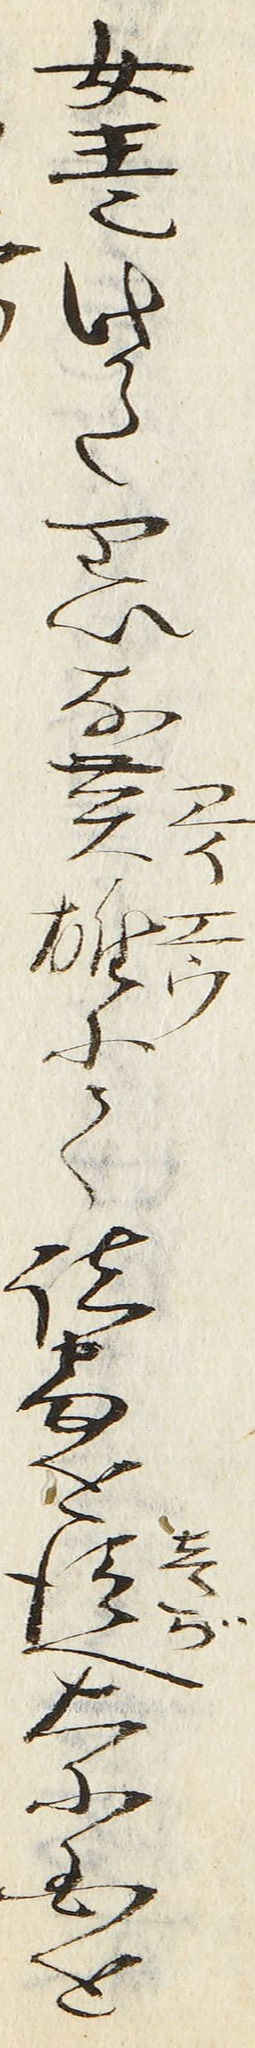女王也此かたりいな莫雄にて諸藩を従へ大小国を
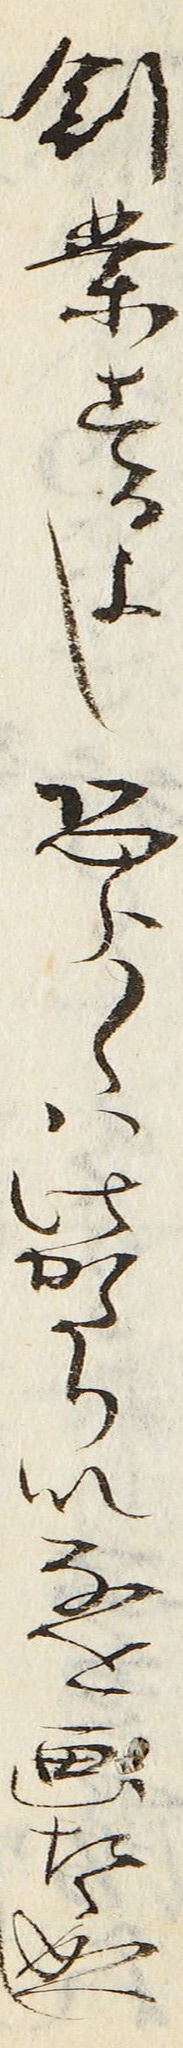創業するよし恐らくは此かたりいなを画たる成へし
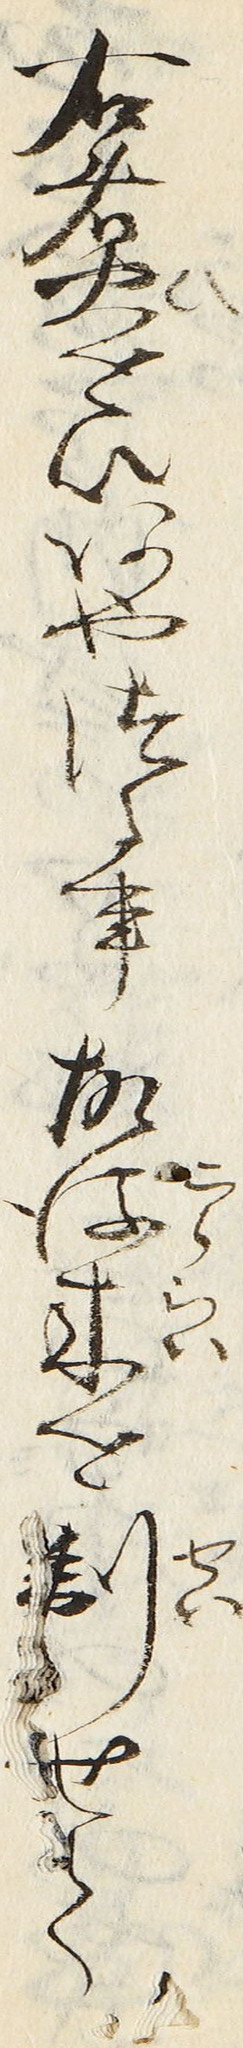右は火を以あやつる事故後来を制せらる
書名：魯西亜国舟渡来始末并日本流漂人異国遍歴之話（西洋欧羅巴州之内一）
